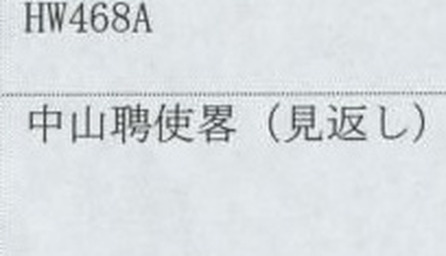中山聘使畧全
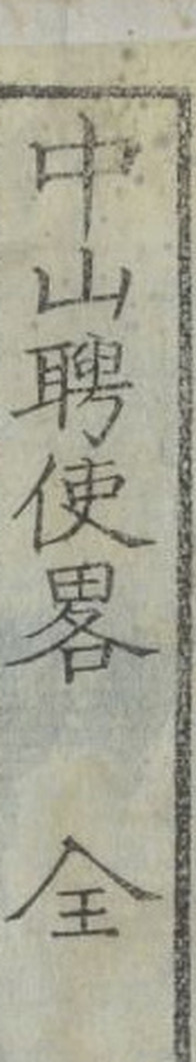中山聘使畧全
